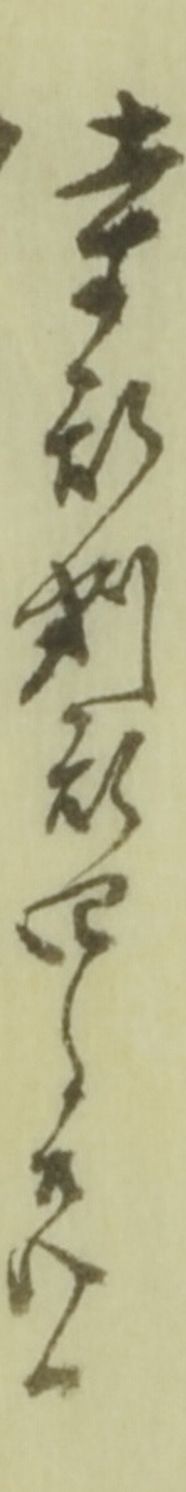寺形判形四月廿八日
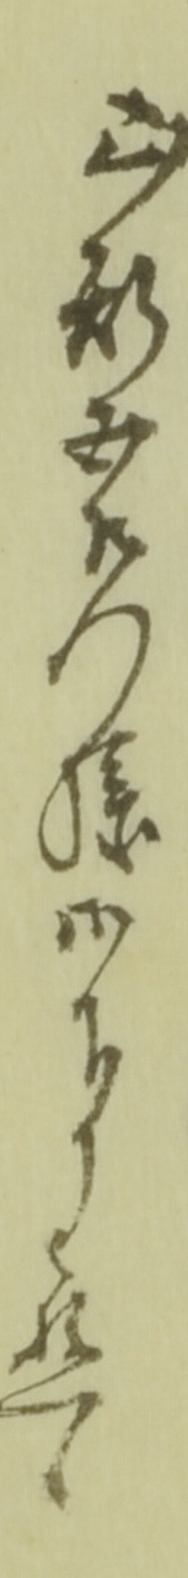山形五左衛門様御下り被遊候
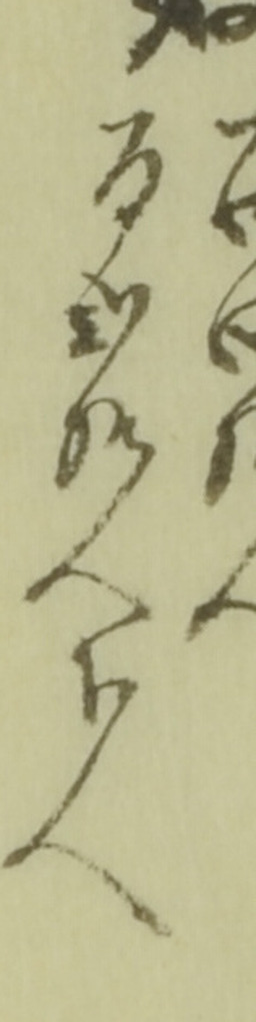百弐拾人下人
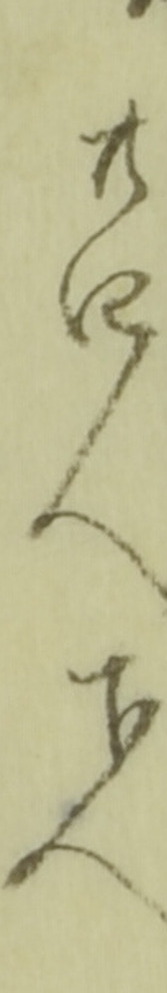廿四人下人

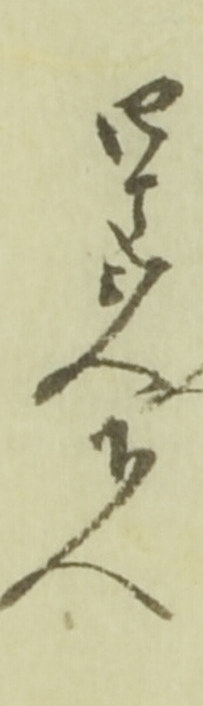四十弐人下人
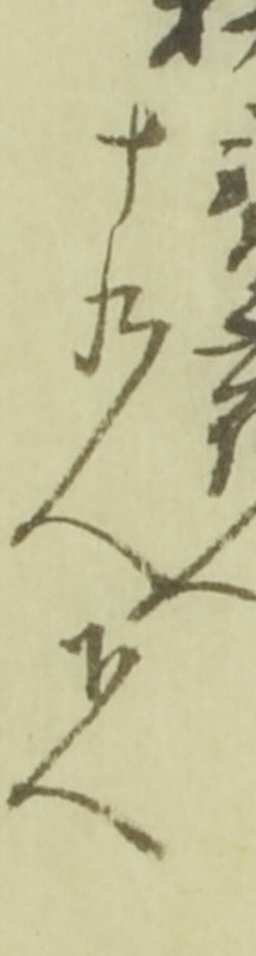十九人下人
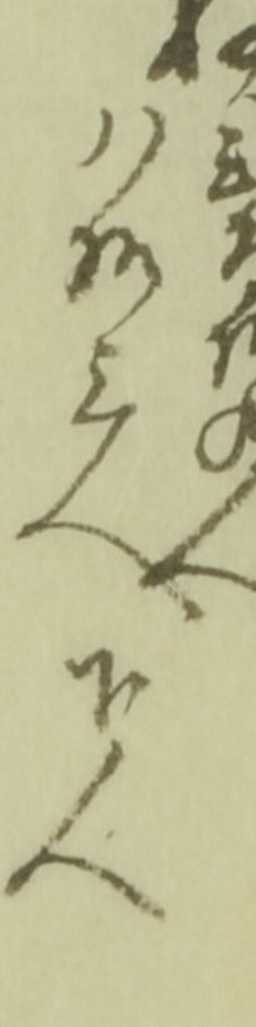八拾三人下人
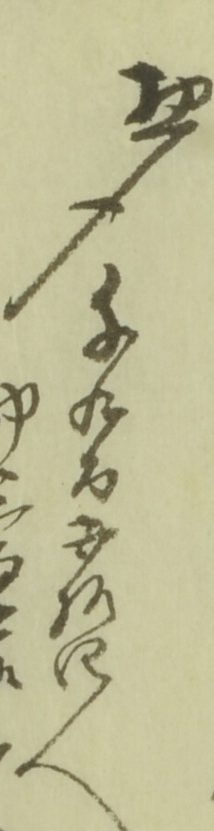惣〆千九百六拾四人
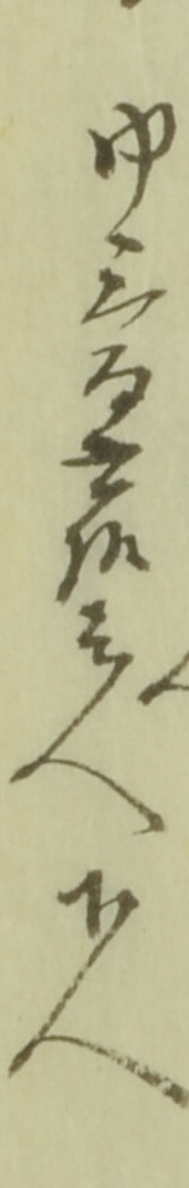内三百六拾壱人下人
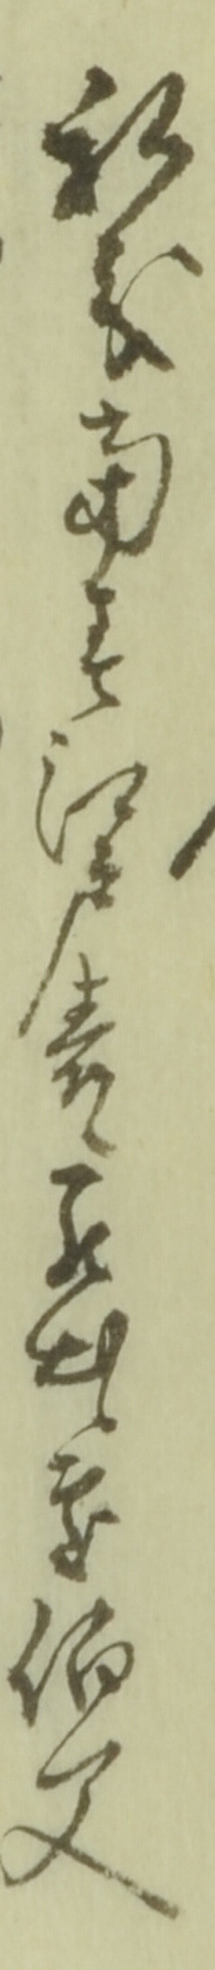私義当春江戸表へ罷出候處伯父
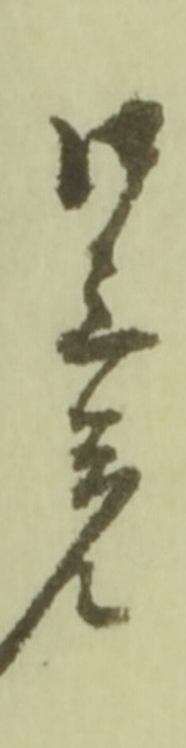御上覚
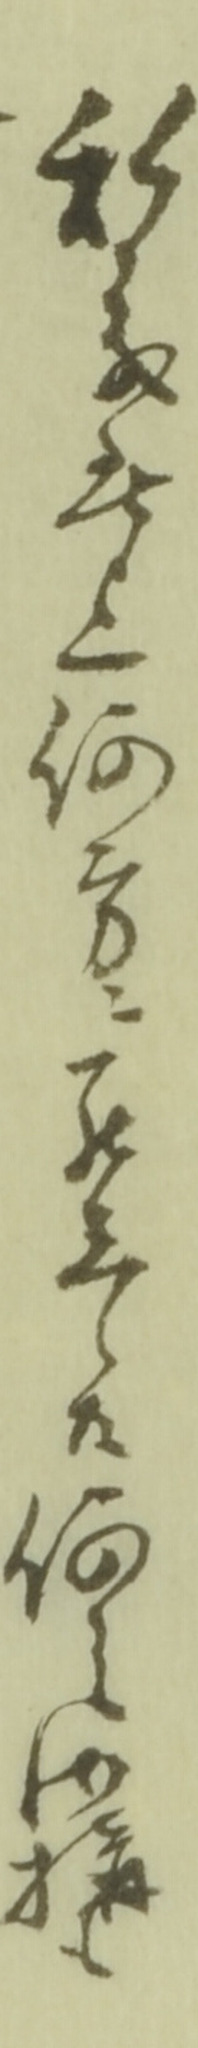私義此上何方ニ罷在候共何之御構も
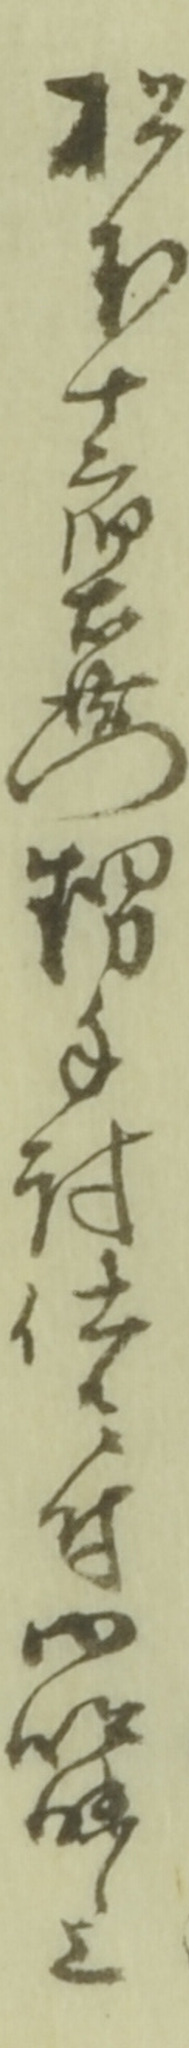松本十郎右衛門甥手討仕候ニ付御吟味之上
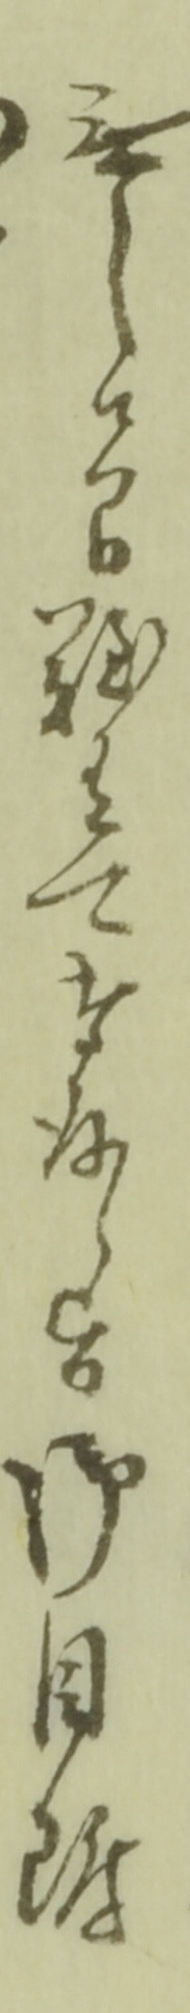無之候間難有可奉存候旨御目附
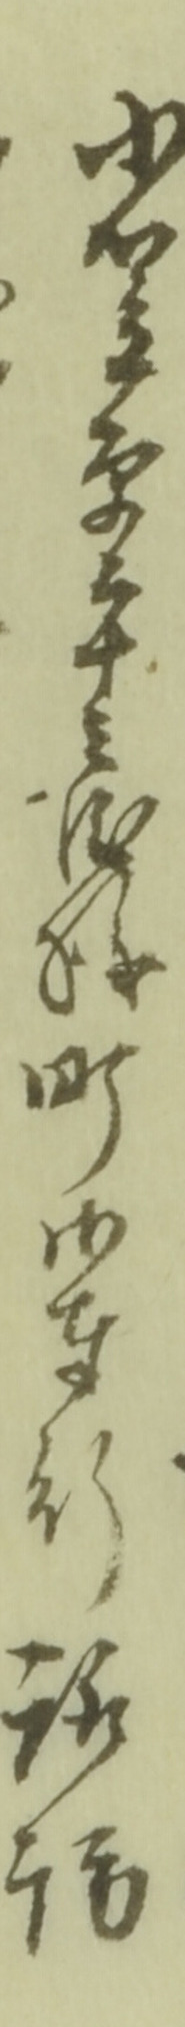小笠原平兵衛様町御奉行諏訪
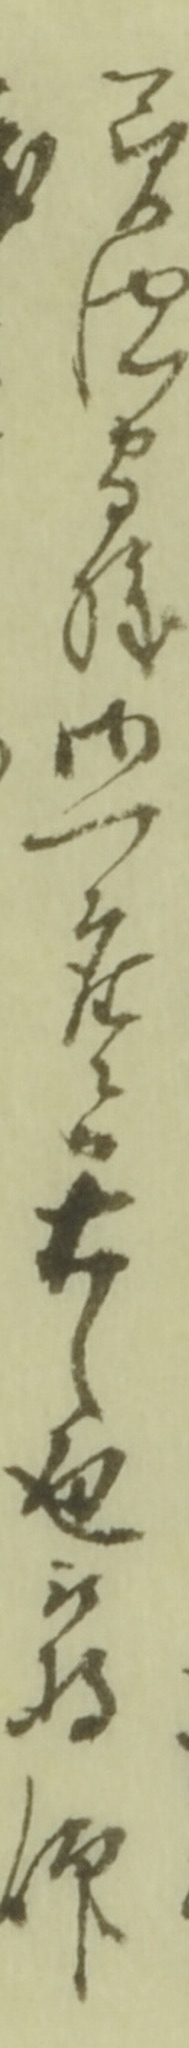美濃守様御一座ニ而右之通被為仰
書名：御公儀様御領主様御触書控
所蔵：伊那市立高遠町図書館・合同会社AMANE
